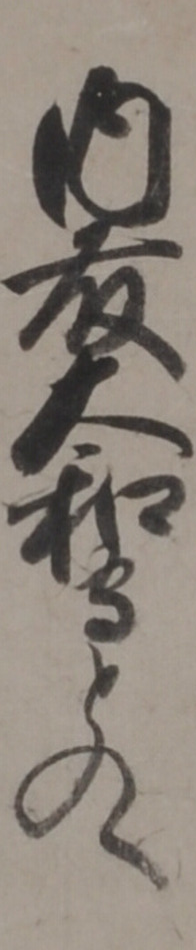内藤大和守とのへ

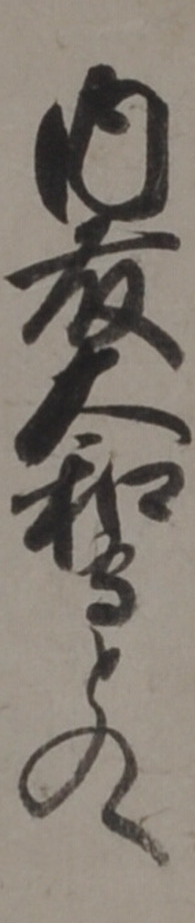内藤大和守とのへ

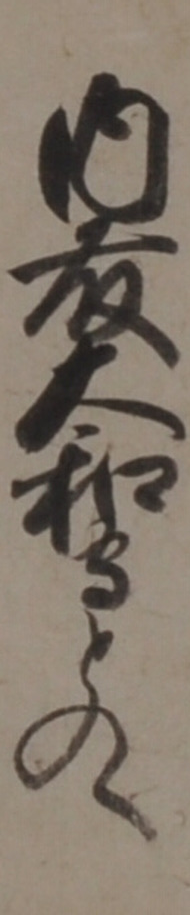内藤大和守とのへ
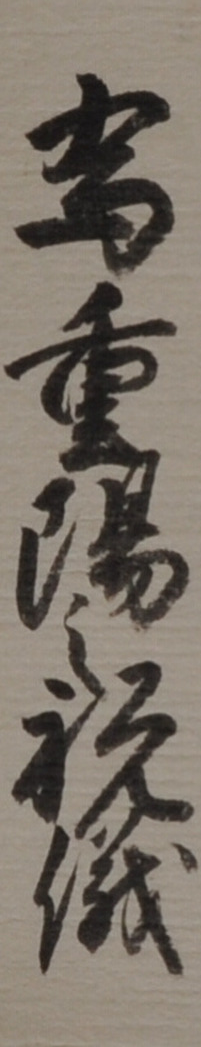為重陽之祝儀
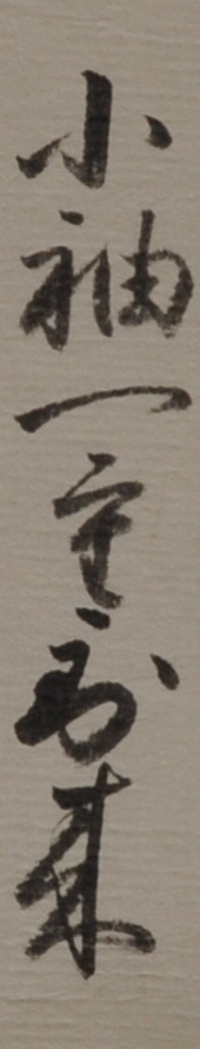小袖一重到来
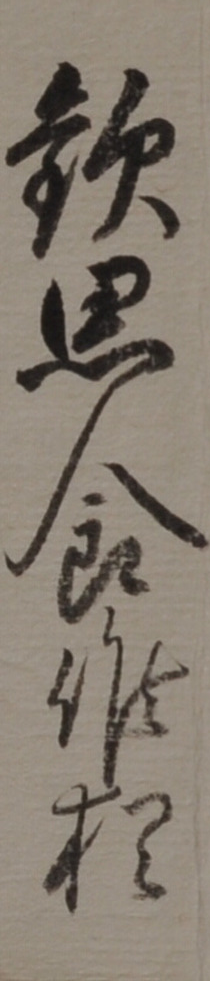歓思食候猶
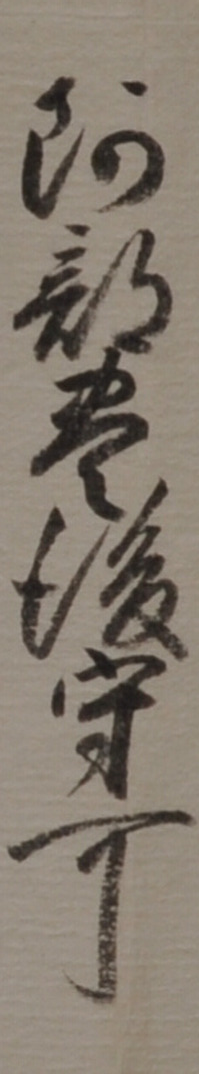阿部豊後守可
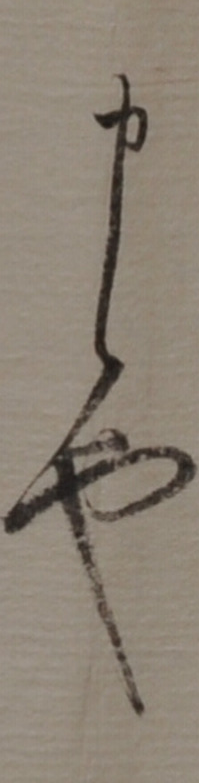申候也
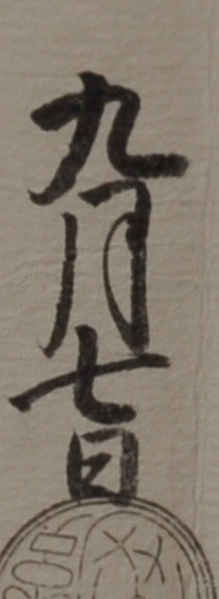九月七日
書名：御内書
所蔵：伊那市立高遠町図書館・合同会社AMANE
